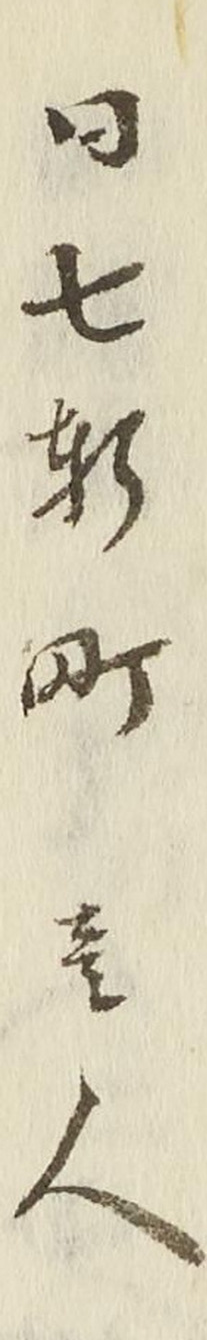同七軒町壱人
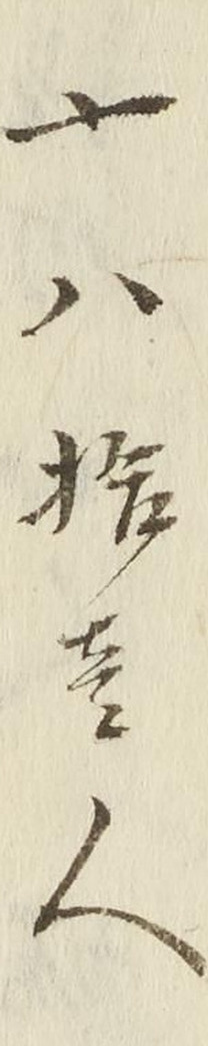〆六拾壱人
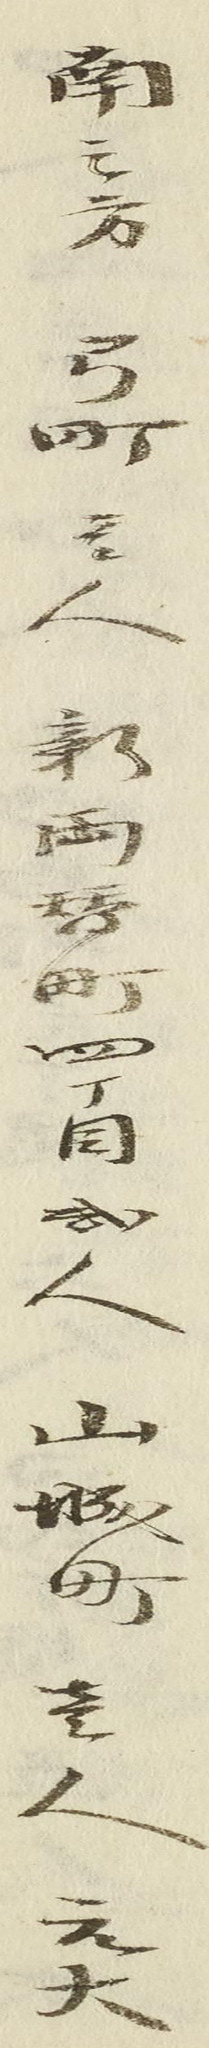南之方弓町壱人新両替町四丁目弐人山城町壱人元大
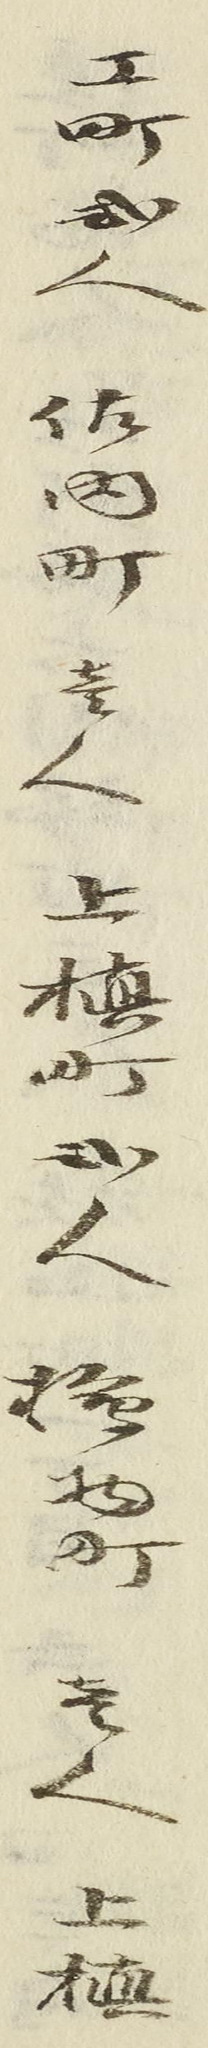工町弐人佐内町壱人上槙町弐人檜物町壱人上槙
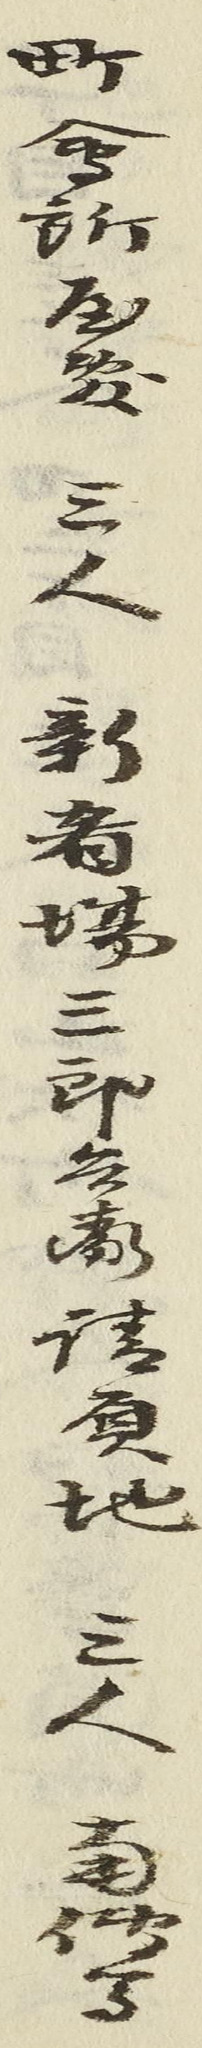町会所屋敷三人新肴場三郎兵衛請負地三人南伝馬
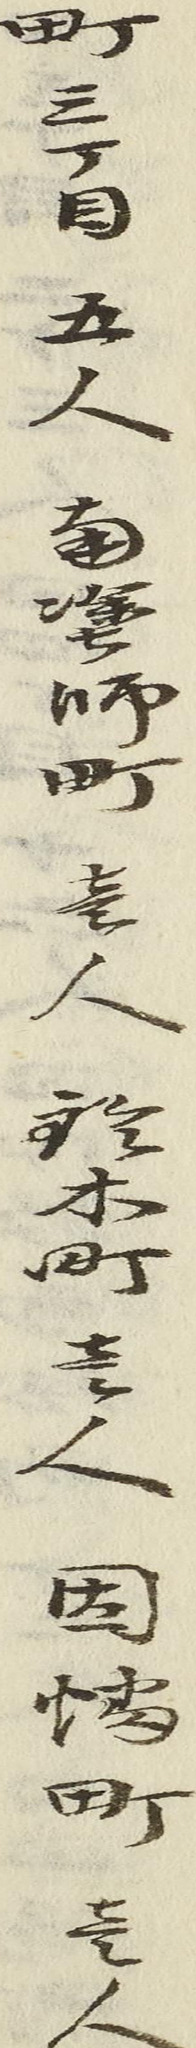町三丁目五人南塗師町壱人鈴木町壱人因幡町壱人
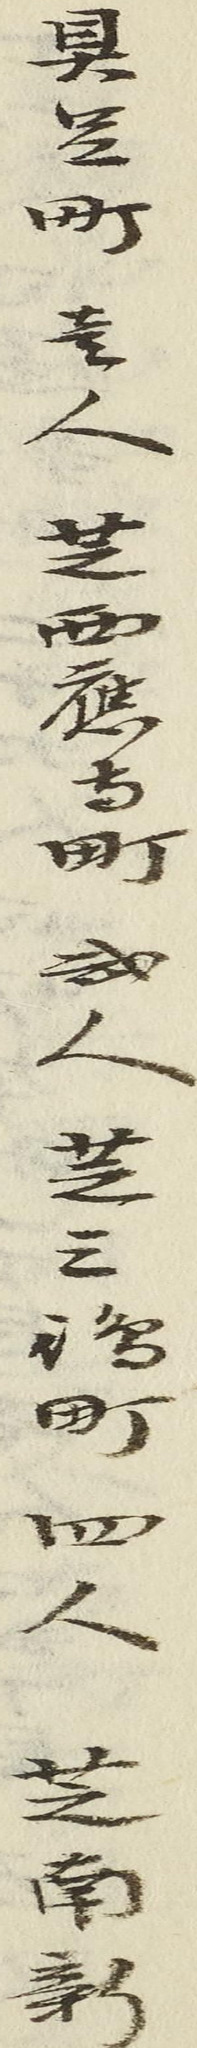具足町壱人芝西応寺町弐人芝三嶋町四人芝南新
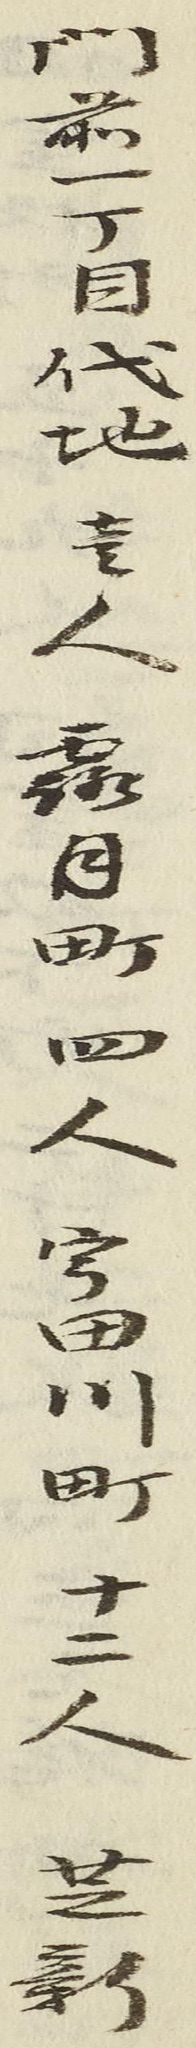門前一丁目代地壱人露月町四人宇田川町十二人芝新
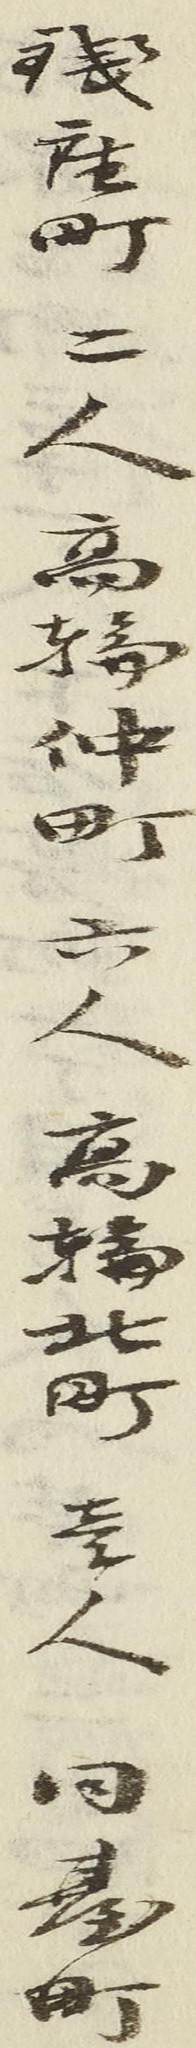銭座町二人高輪仲町六人高輪北町壱人同寿町
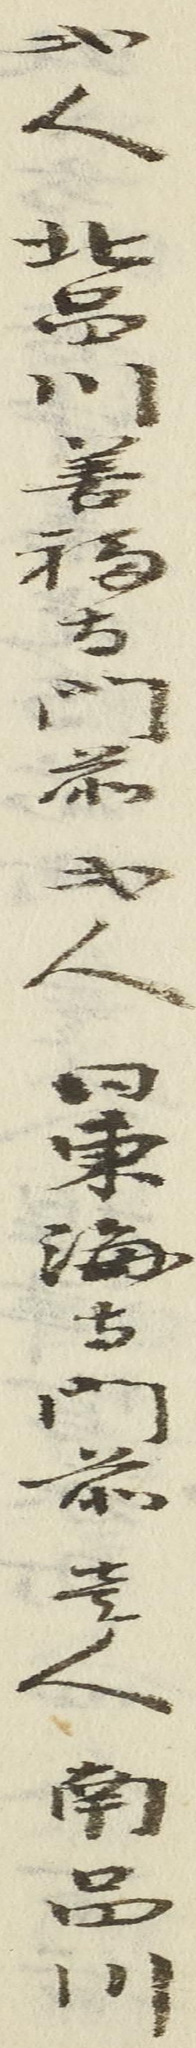弐人北品川善福寺門前弐人同東海寺門前壱人南品川
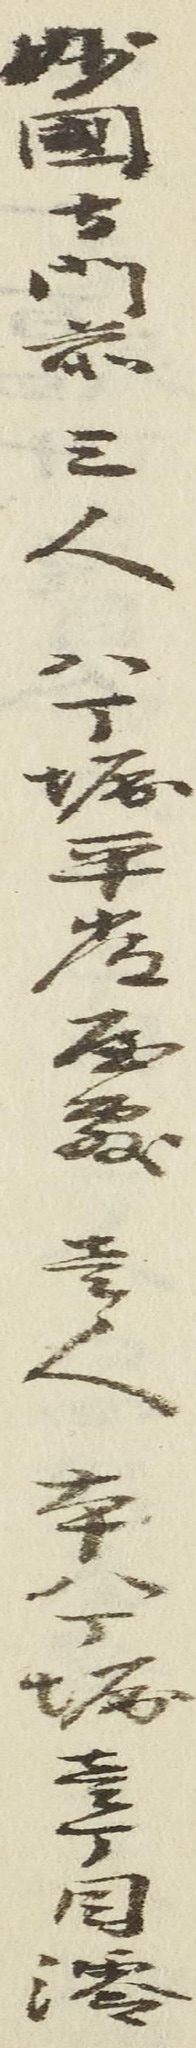妙国寺門前三人八丁堀平常屋敷壱人本八丁堀壱丁目澪
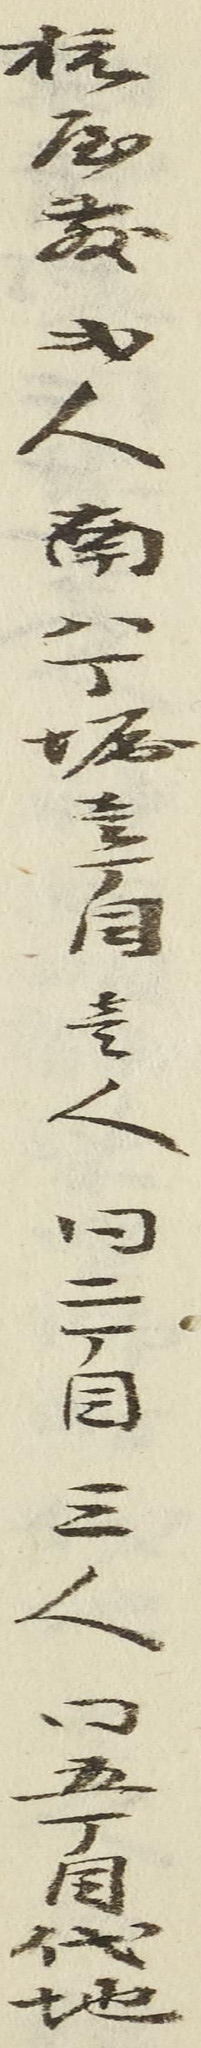杭屋敷弐人南八丁堀壱丁目壱人同二丁目三人同五丁目代地
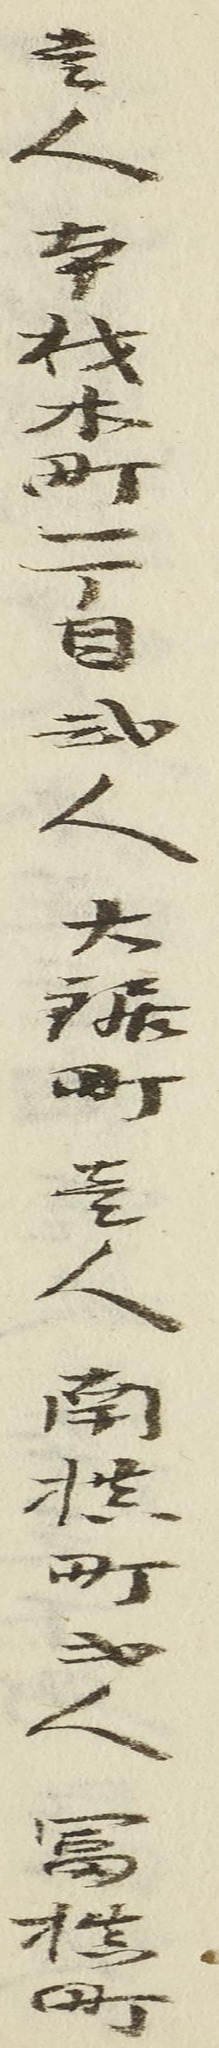壱人本材木町一丁目弐人大鋸町壱人南槙町弐人冨槙町
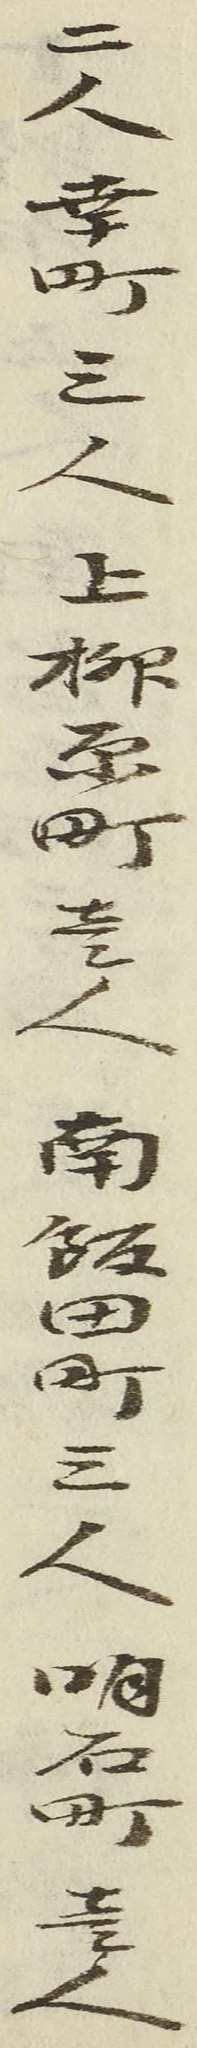二人幸町三人上柳原町壱人南飯田町三人明石町壱人+

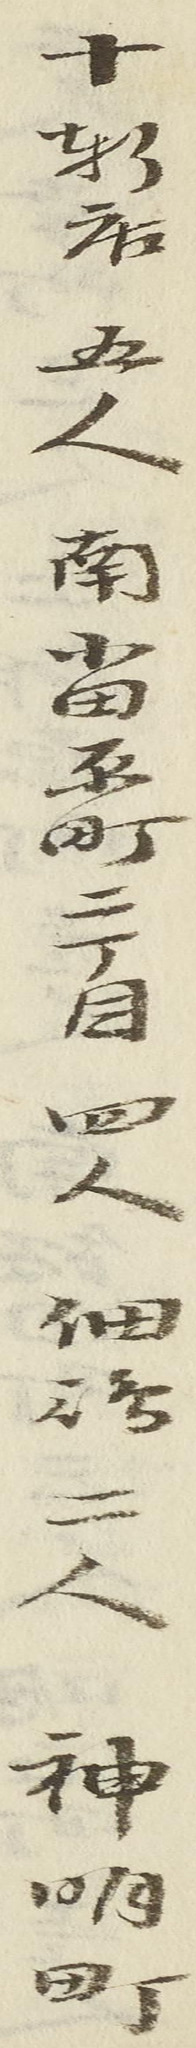十軒店五人南小田原町四人佃嶋二人神明町
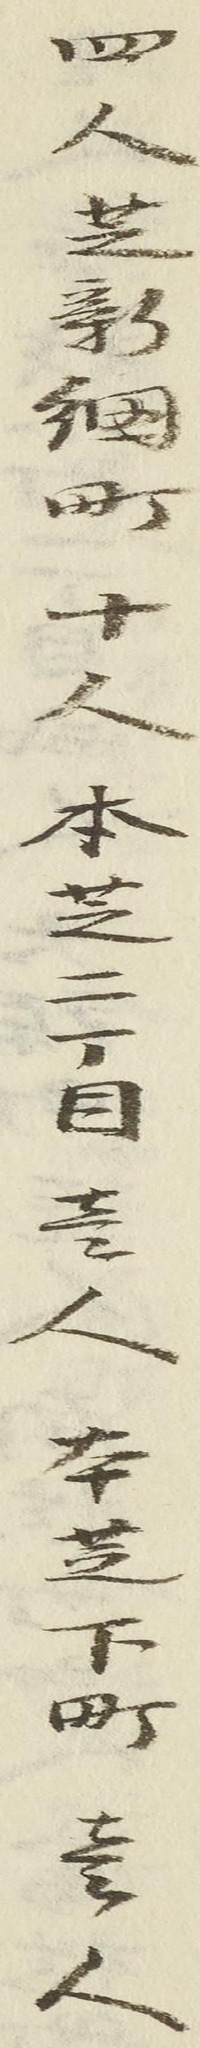四人芝新網町十人本芝二丁目壱人本芝下町壱人
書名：那為の後見艸　全
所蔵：東京大学地震研究所図書室 Earthquake Research Institute Library, The University of Tokyo, JAPAN
